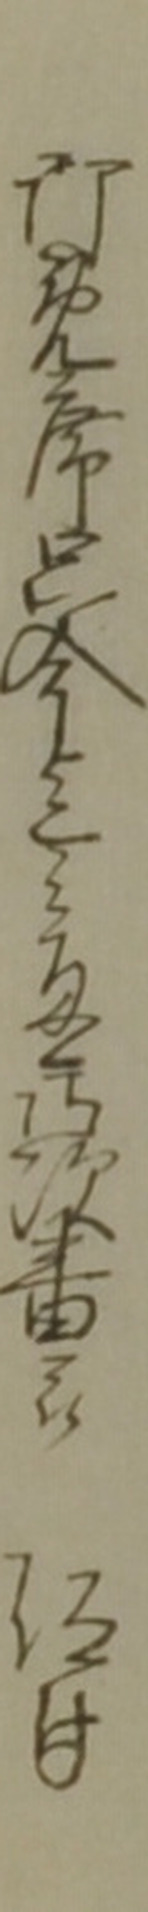御免席只今迄之通御次番被仰付
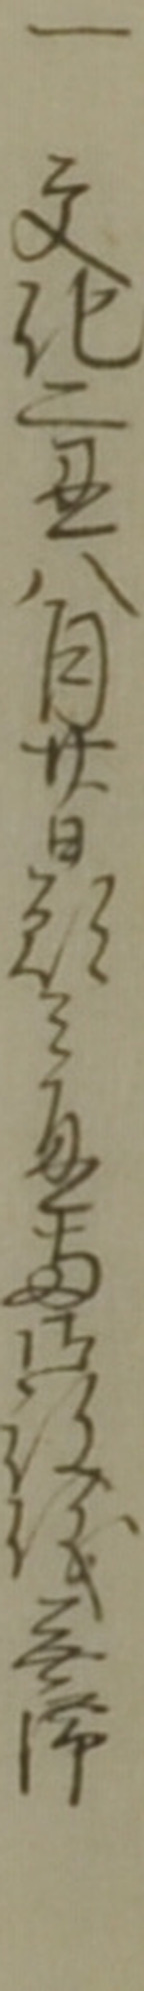一文化丑八月願之通両御役儀無滞
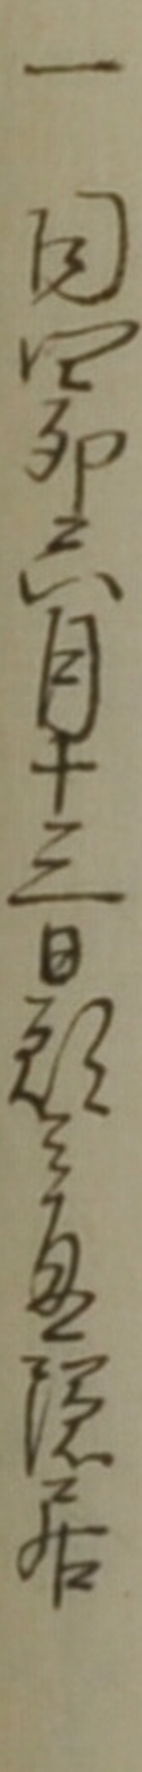一同四卯六月十三日願之通隠居
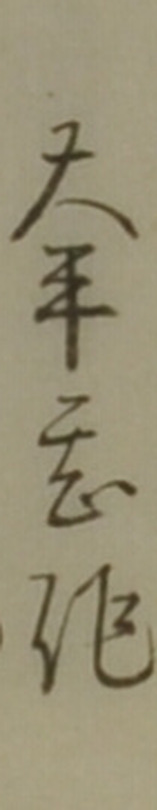大平甚作

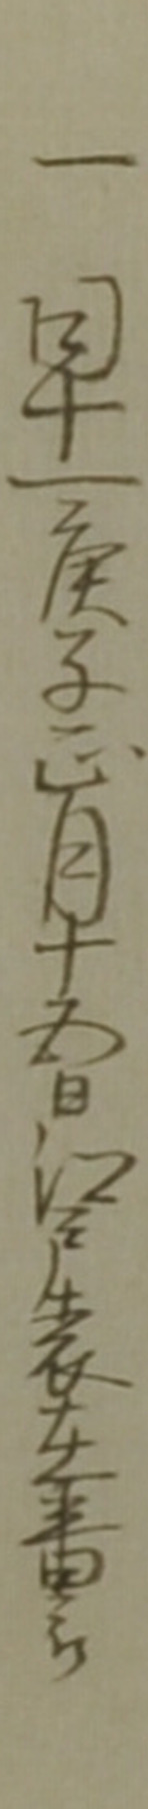一同十一庚子正月十五日江戸表在番被
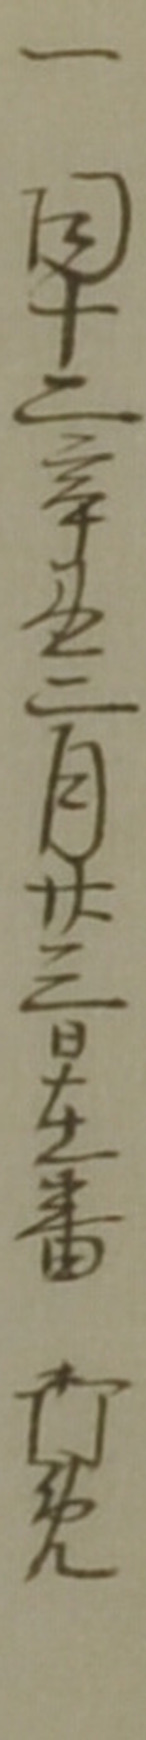一同十二辛丑二月廿三日在番御免
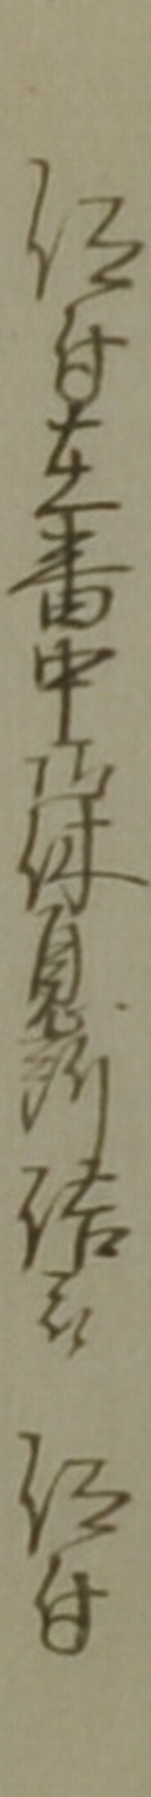仰付在番中御休息所詰被仰付
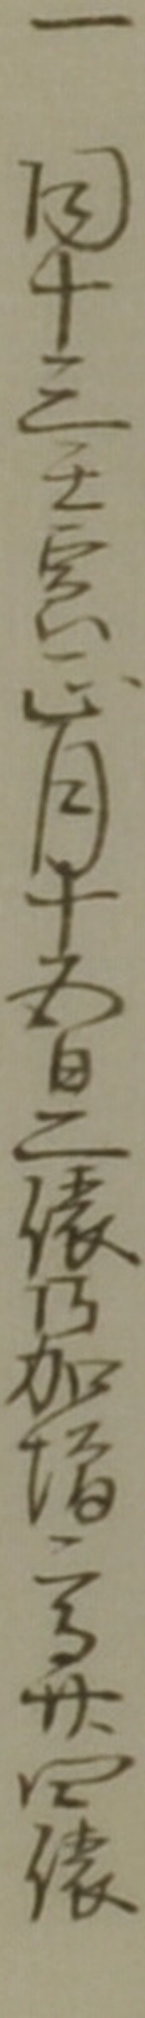一同十三壬寅正月十五日二俵御加増高廿四俵
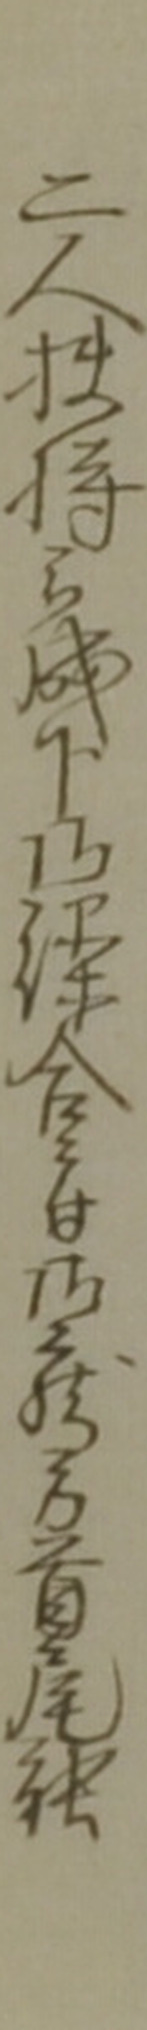二人扶持被成下御繰合ニ付御蔵方首尾能
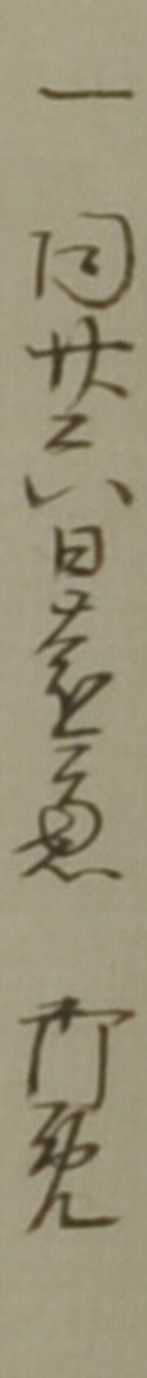一同廿六日遠慮御免

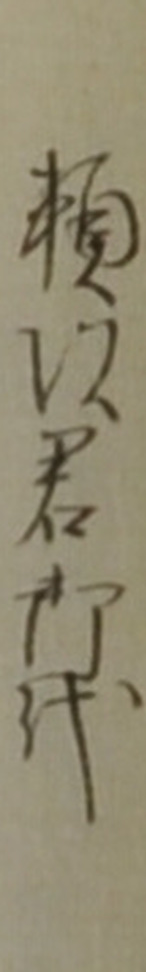頼以君御代
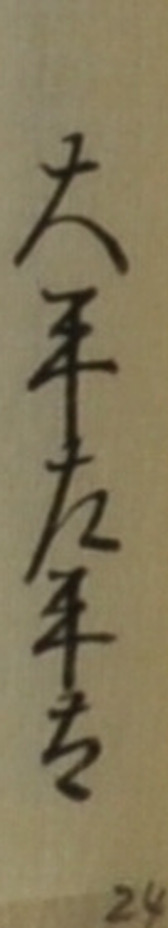大平左平太
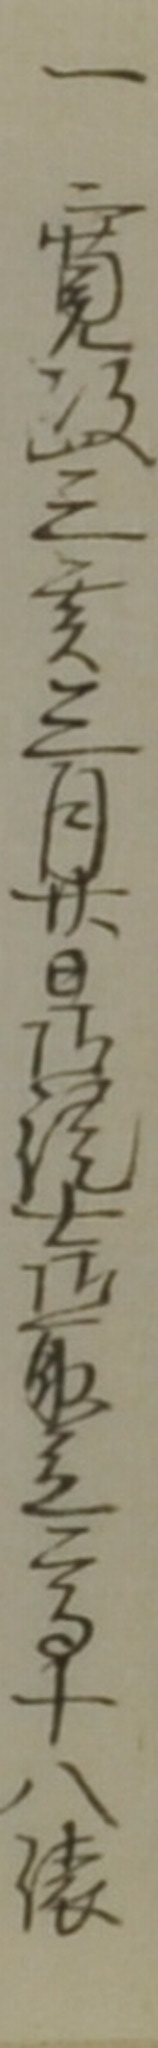一寛政三亥三月廿日御徒士取立高十八俵
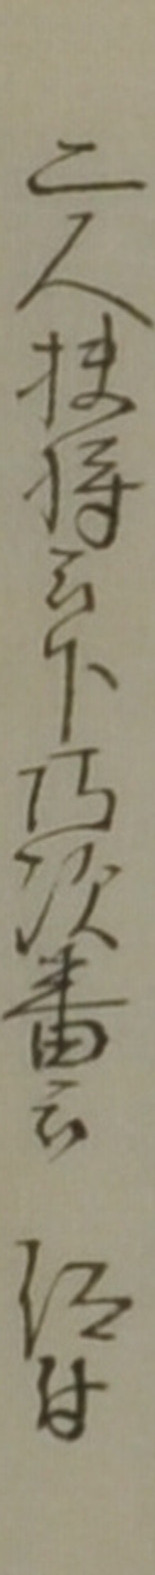二人扶持被下御次番被仰付
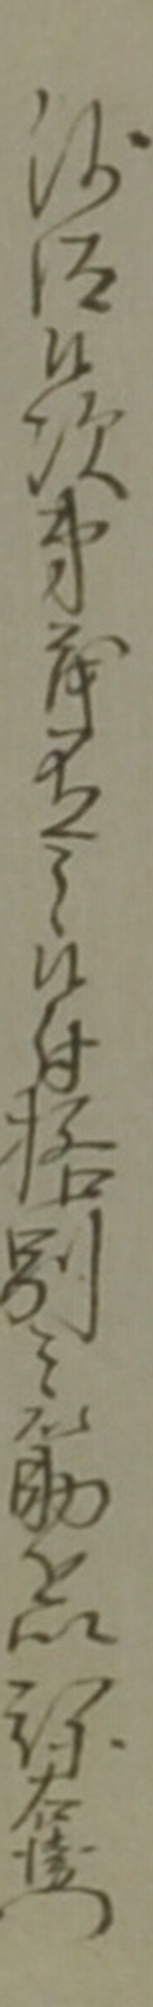沙汰候次第義有之候付格別之筋を以弥右衛門
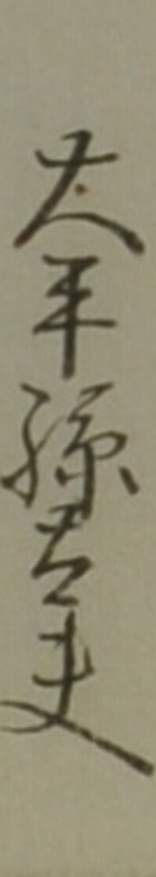大平孫太夫
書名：無足諸士勤仕録（六）
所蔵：伊那市立高遠町図書館・合同会社AMANE
